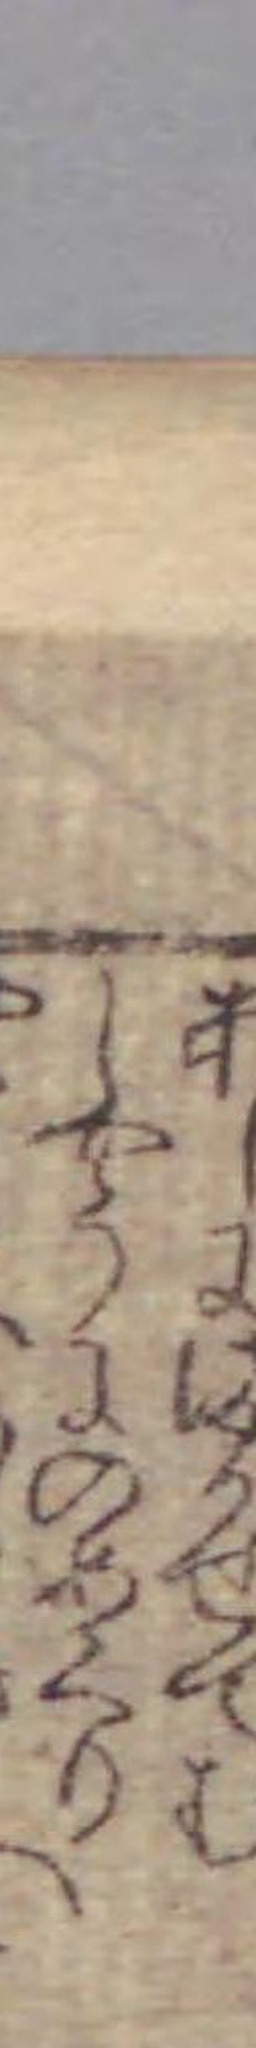しやうにのめくり
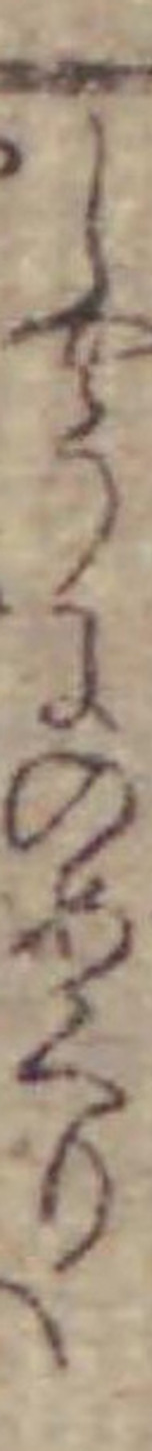しやうにのめくり
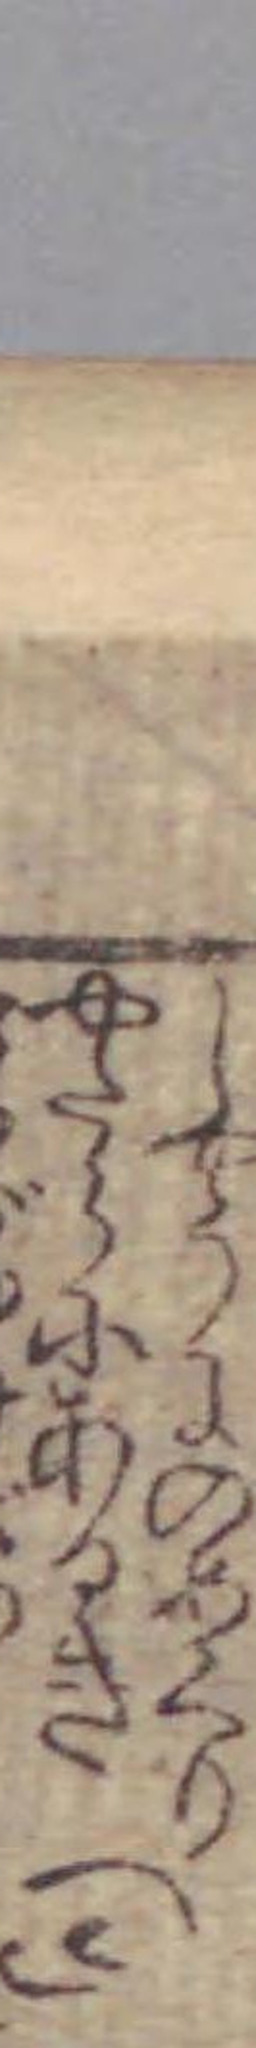やたらにあるき
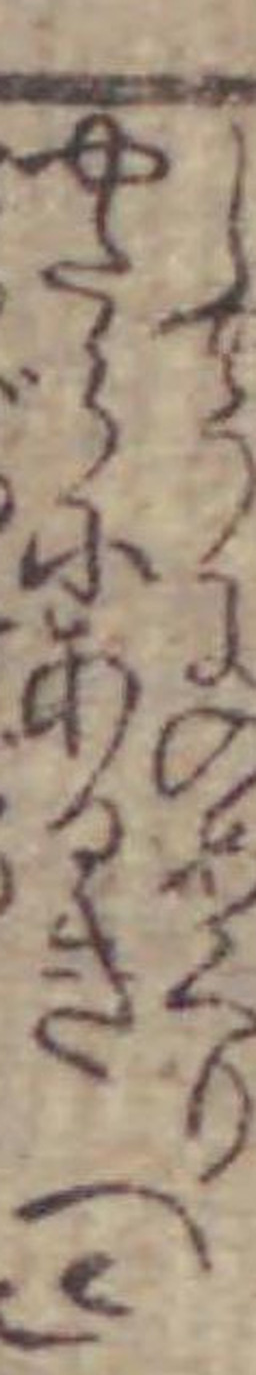やたらにあるき
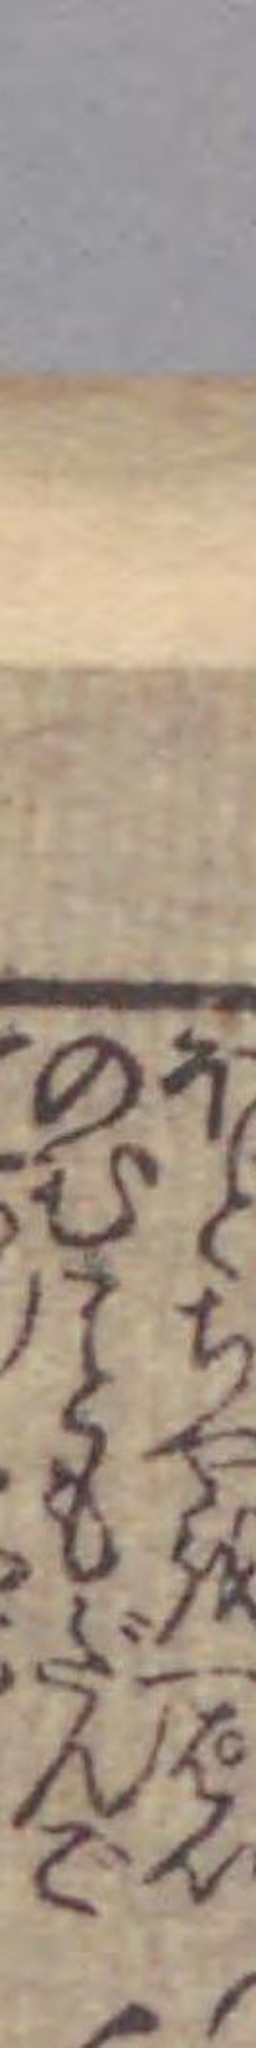のむこともだんご
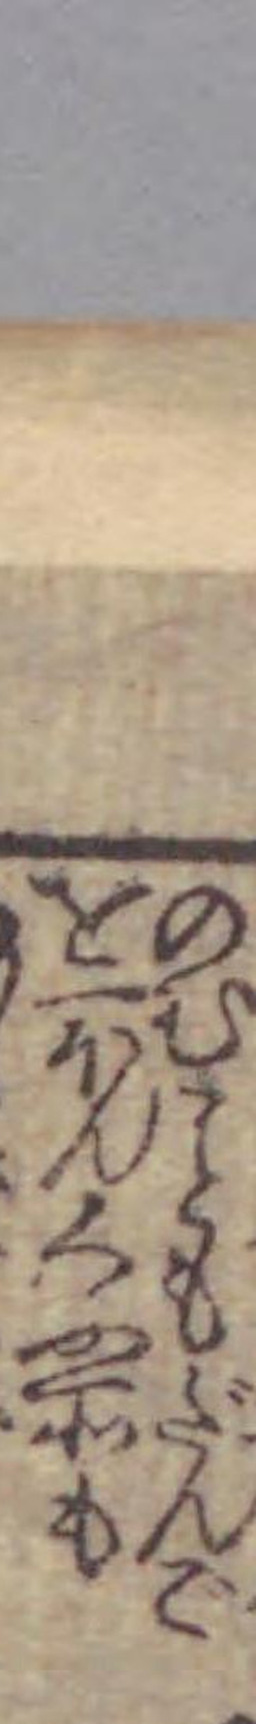を一ほんくふ所も
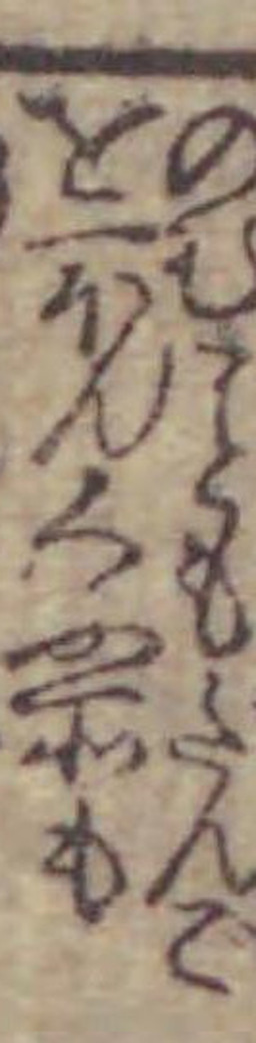を一ほんくふ所も
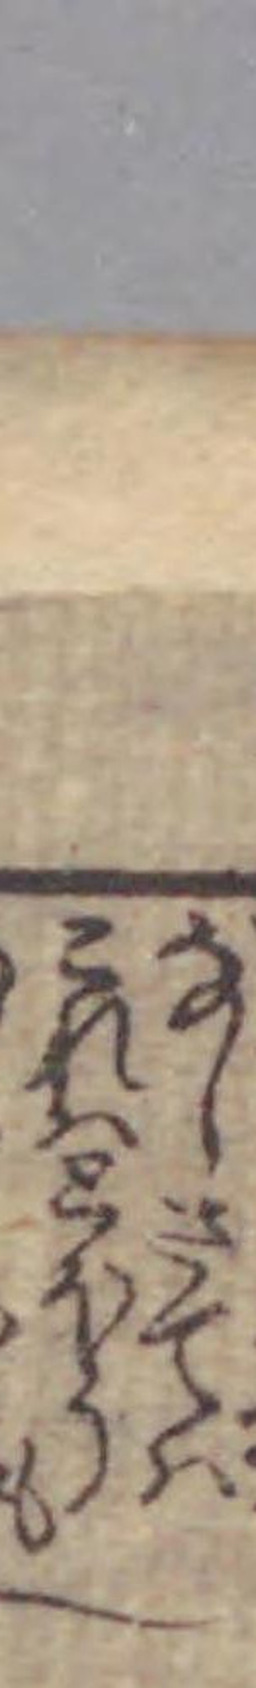これはとほうも
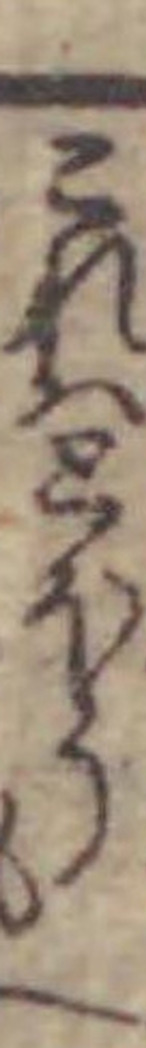これはとほうも
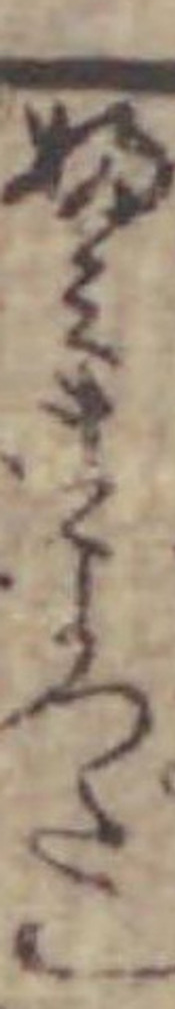ふみまよつた
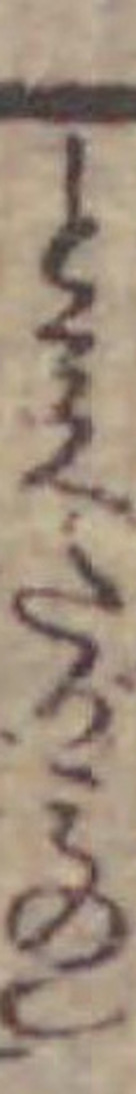とみへさがみの
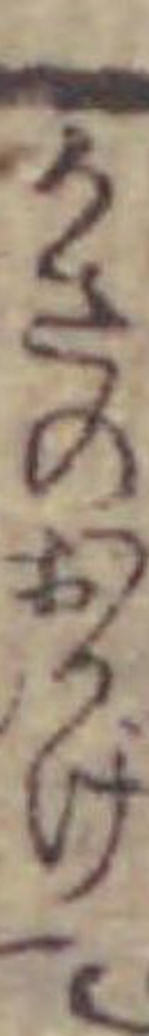かたのおかげ
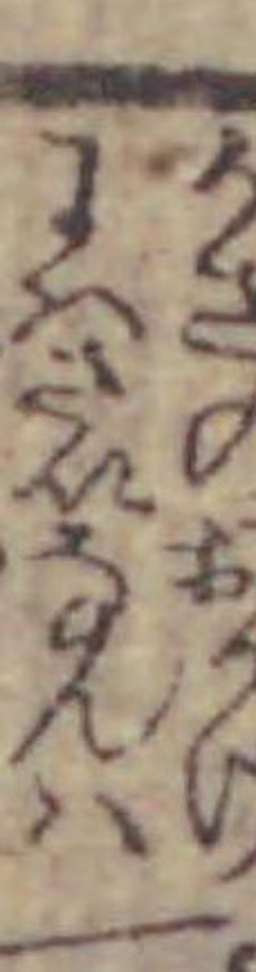にはさいなんは
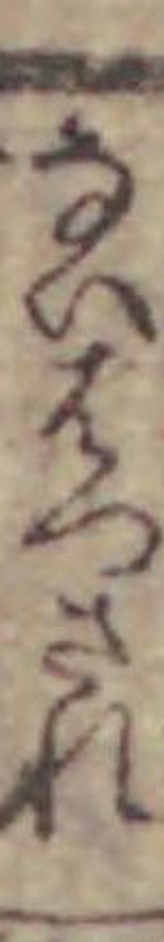ないはつされ
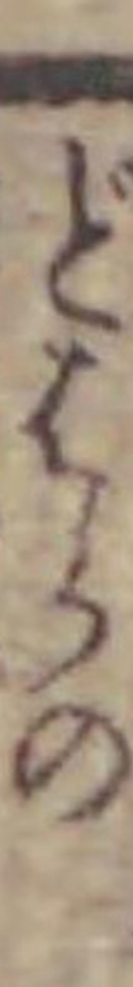どはらの
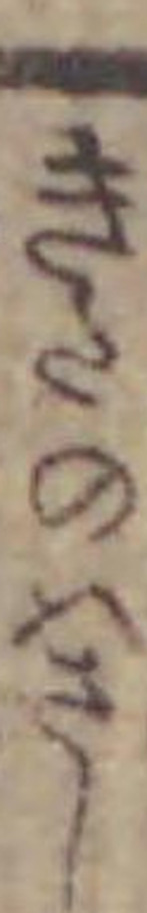きたのはさし
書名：即席耳学問 : 3巻
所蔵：国立国会図書館 National Diet Library, JAPAN
